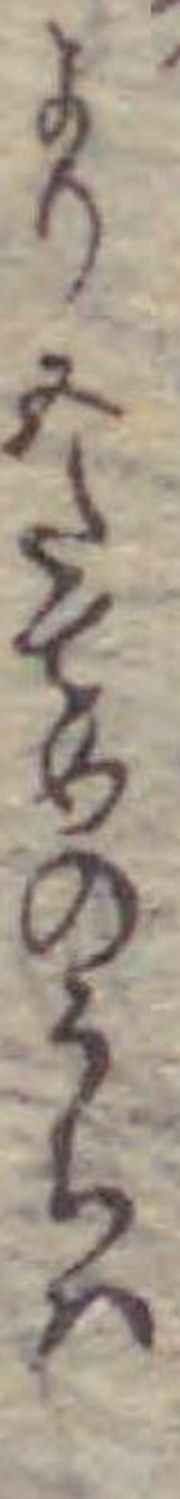より五たてめのうちは
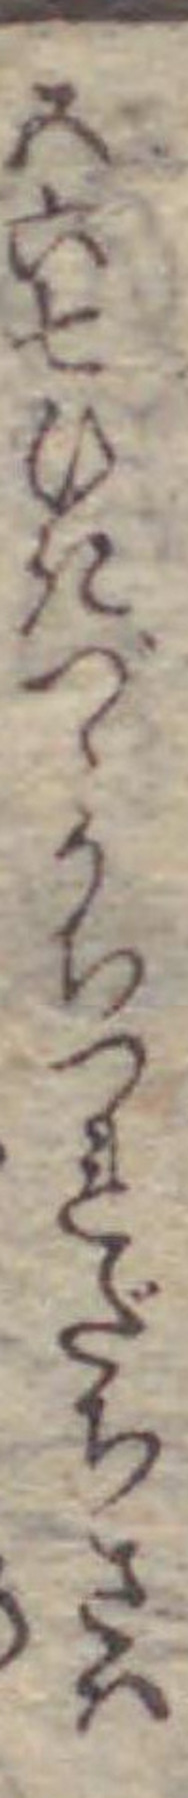五六七ひきづゝうちつれだちさは
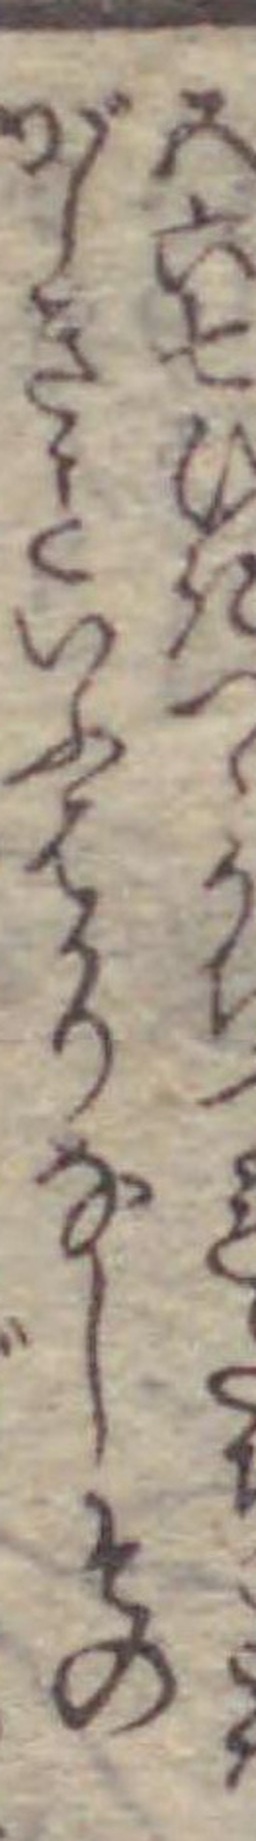がしきこといふはかりなしその
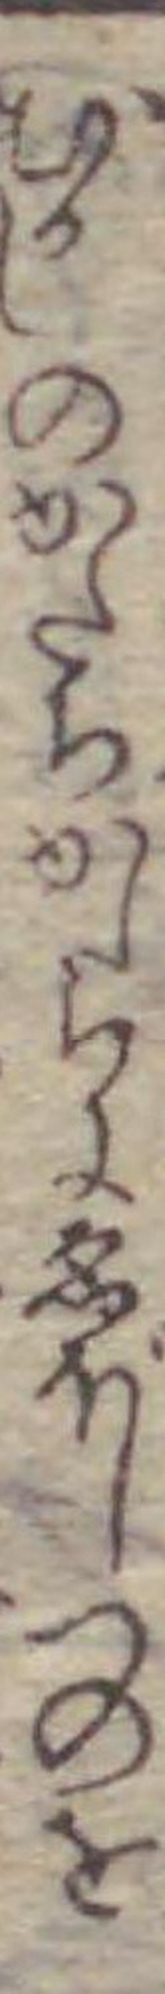むかしのかたちかしらにゑぼしつのを
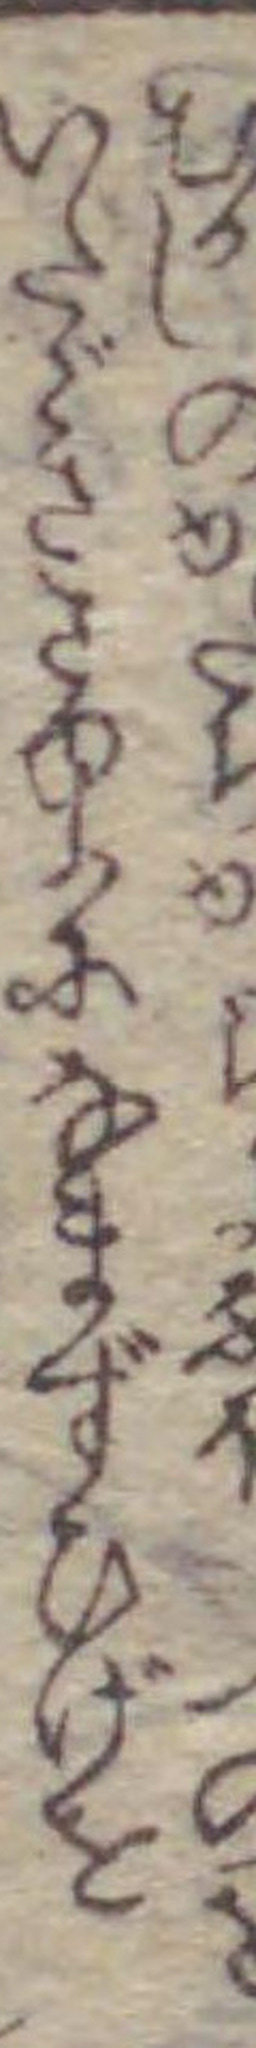いたゞきさゆふになまずひげを
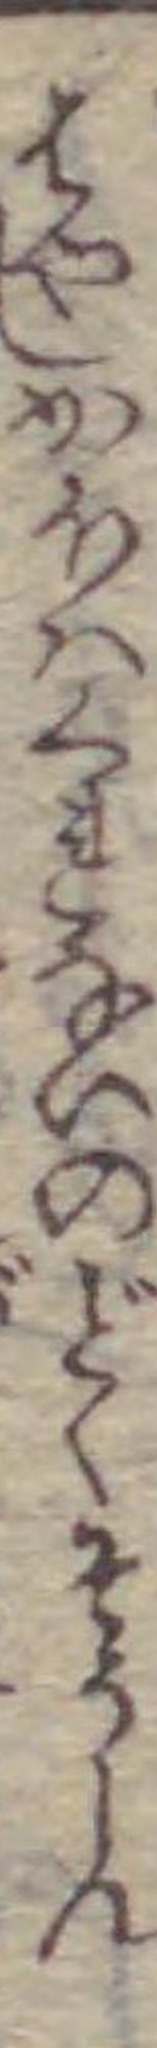はやしかほはくれないのごとくそうしん
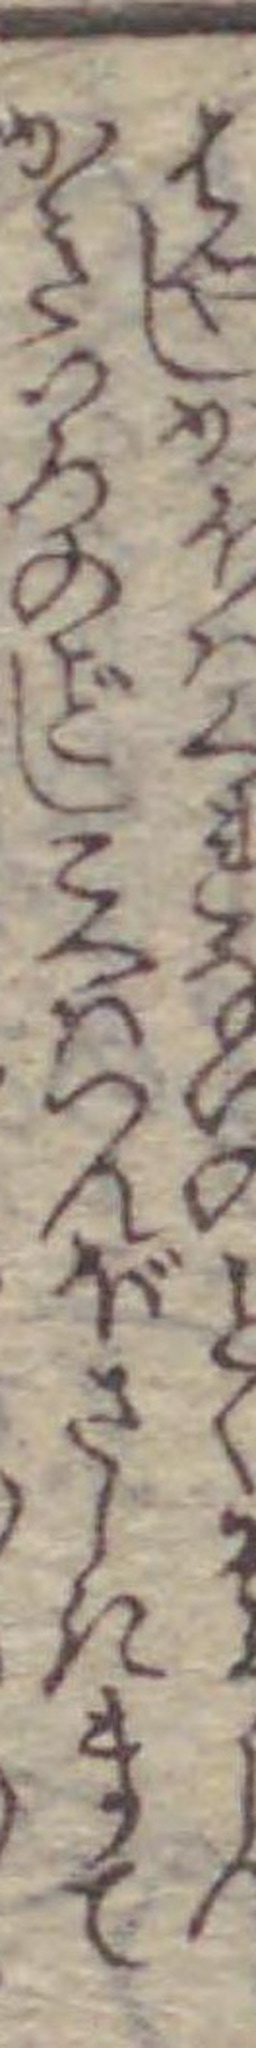かきいろのごとしこへはつんぼさしきまて
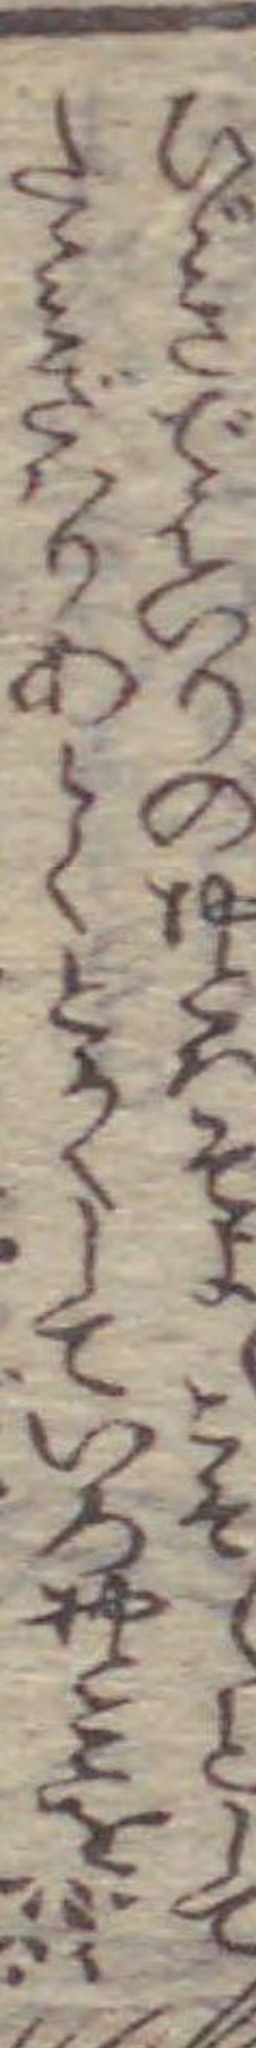たゝみざはりあらくとかくしていろおとこを
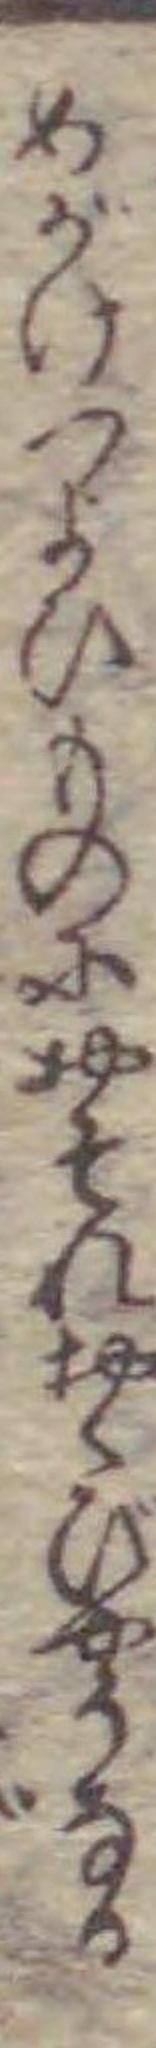めがけつよひものにおそれおくびやうなる
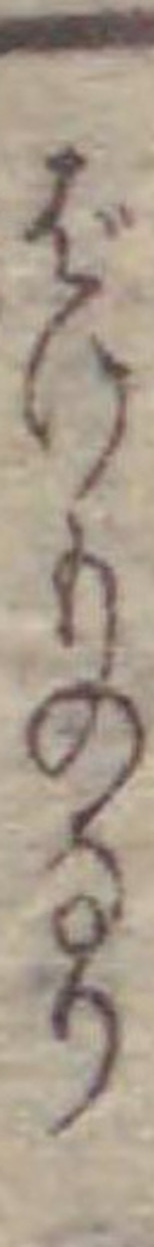ばけものなり
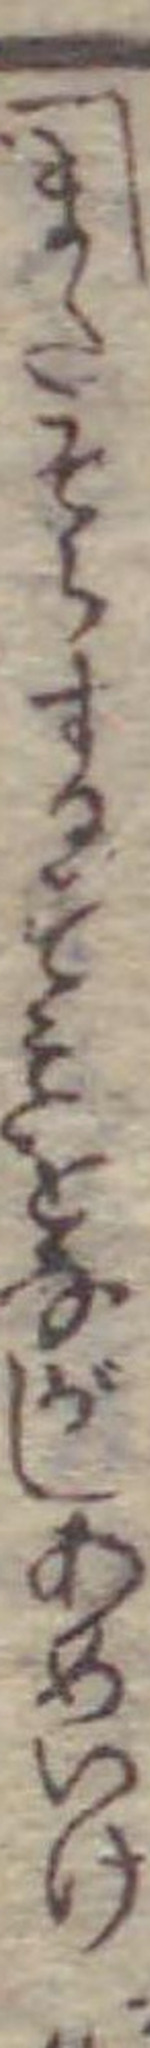〽またそらするすみをながしあめいけ
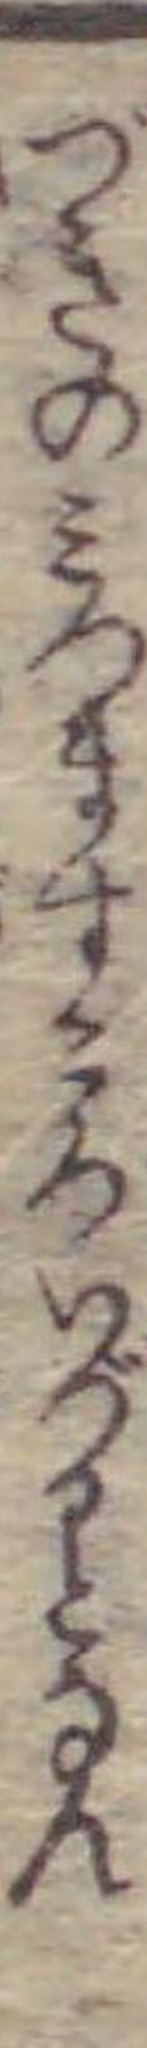づきのみつますころいづるとなん
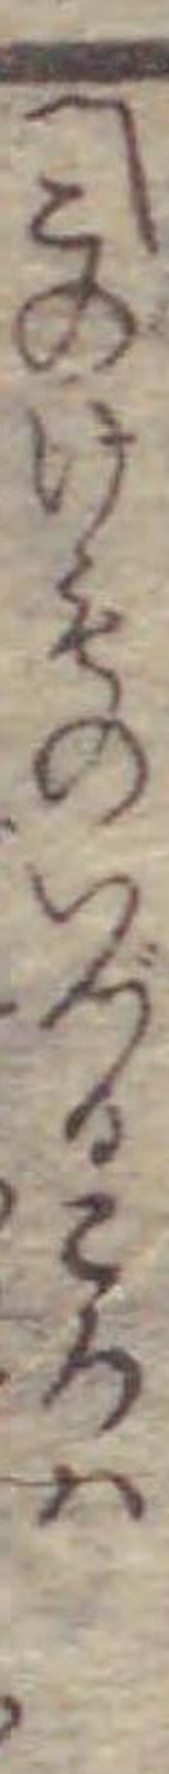〽このけものいづるころは
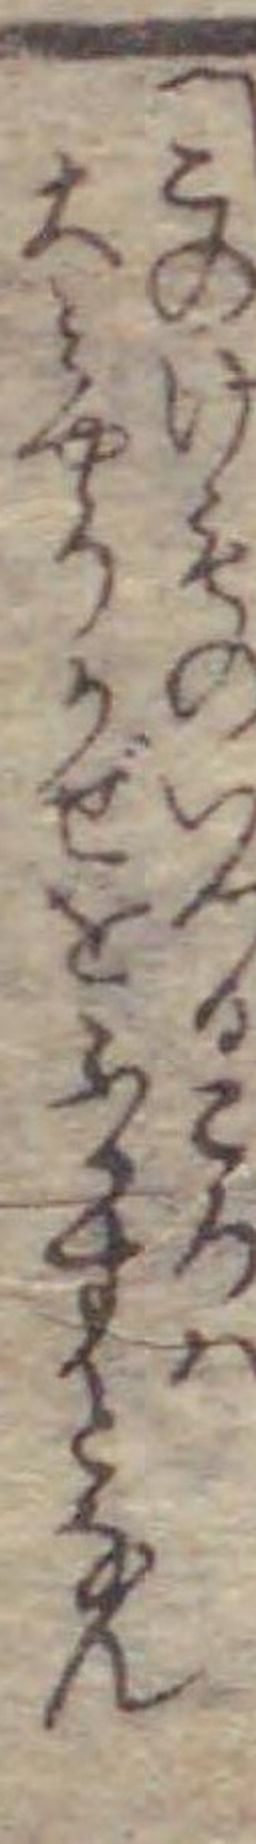大みやうかぜをふかすとなん

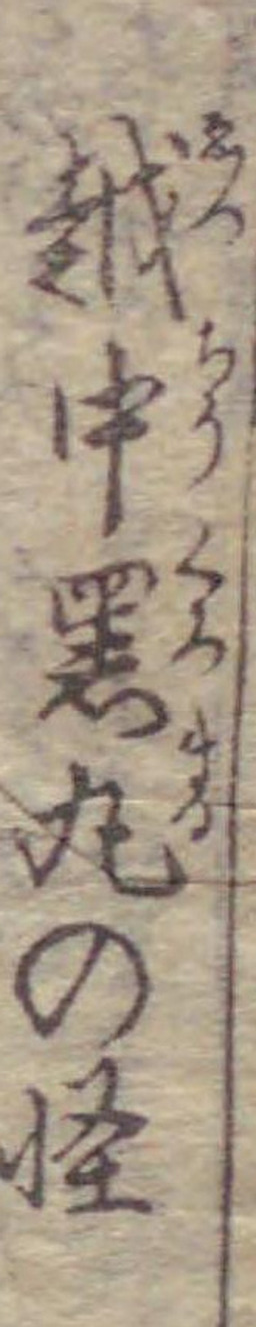越中黒丸の怪
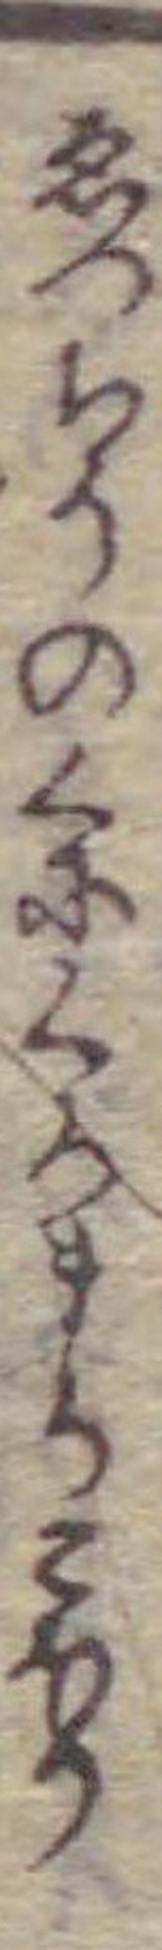えつちうのくにくろまるこほり
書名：武家物奇談 : 3巻
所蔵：国立国会図書館 National Diet Library, JAPAN
